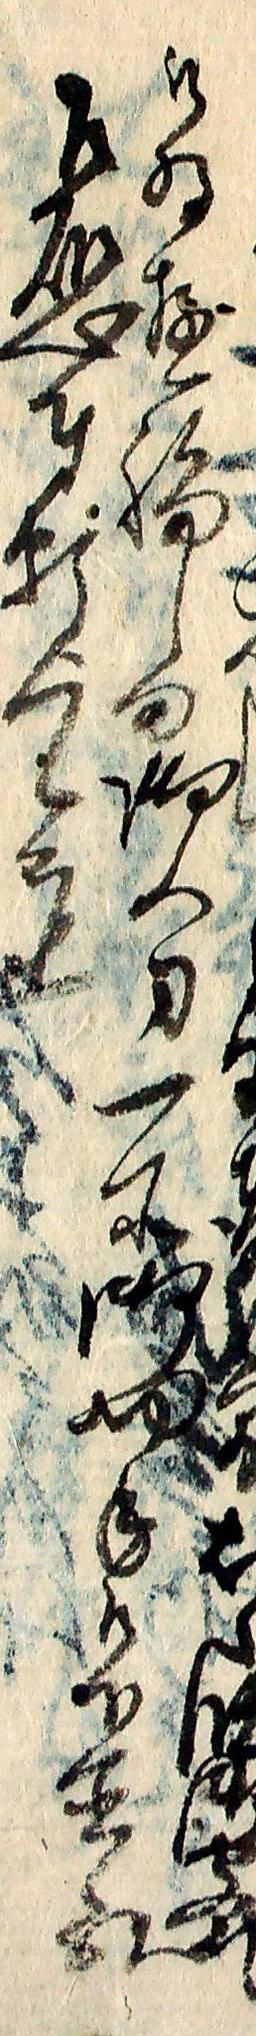乍恐奉願上候已上
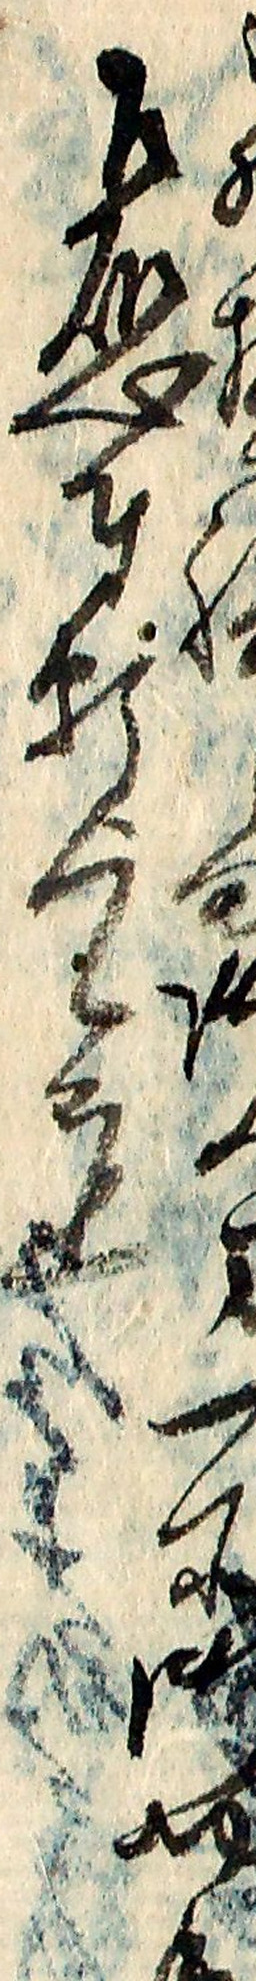乍恐奉願上候已上
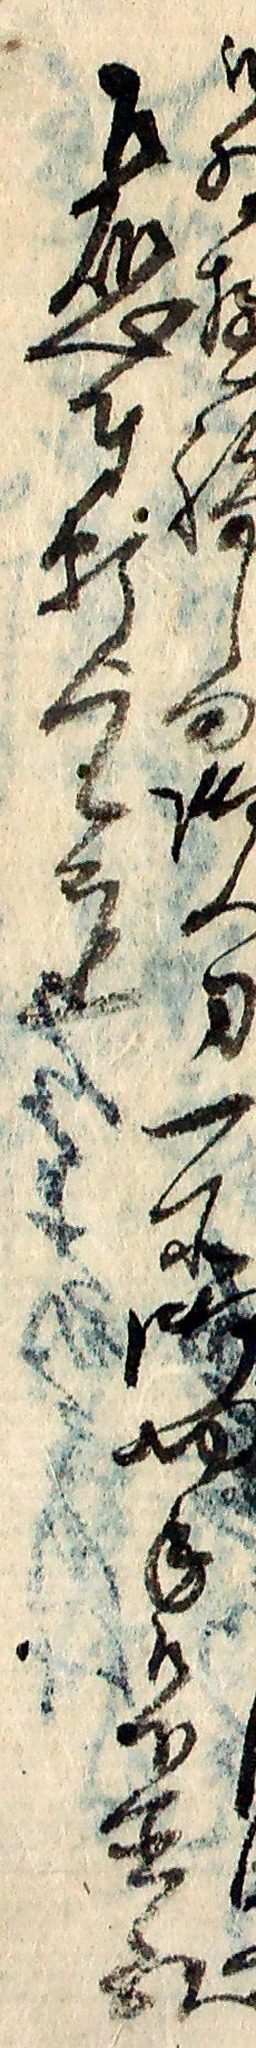乍恐奉願上候已上

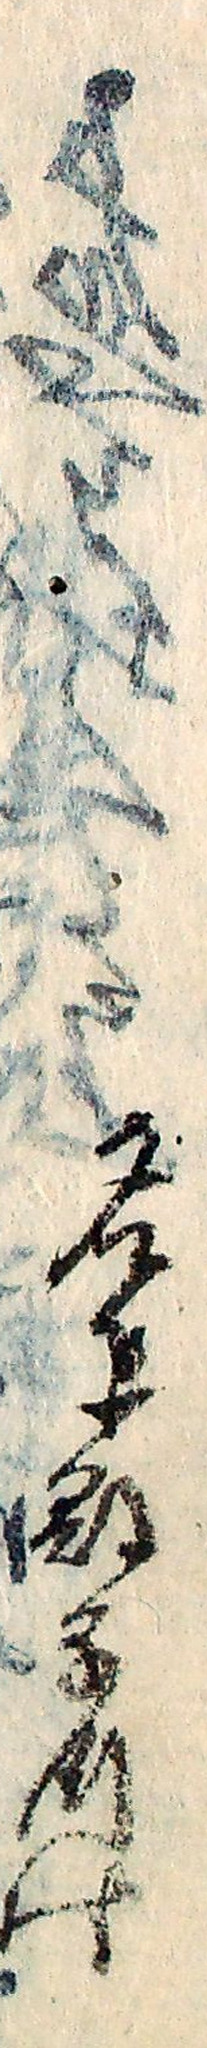名東郡早淵村
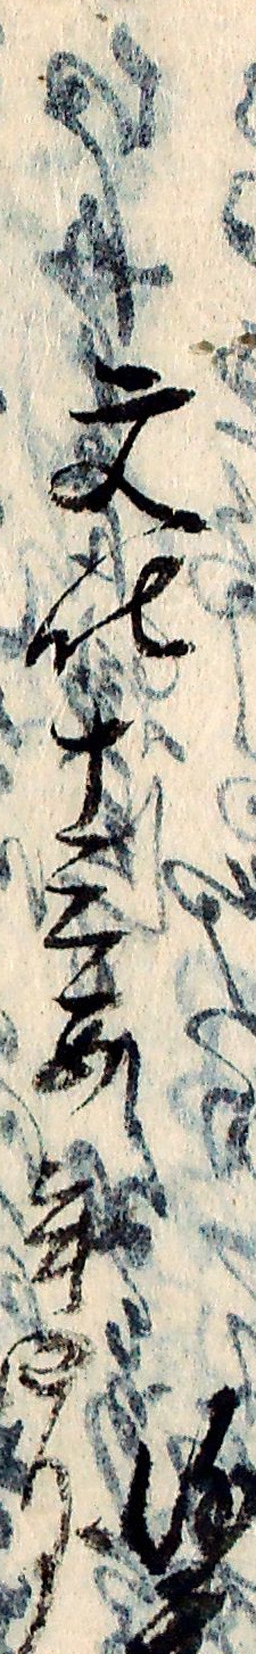文化十三子年四月
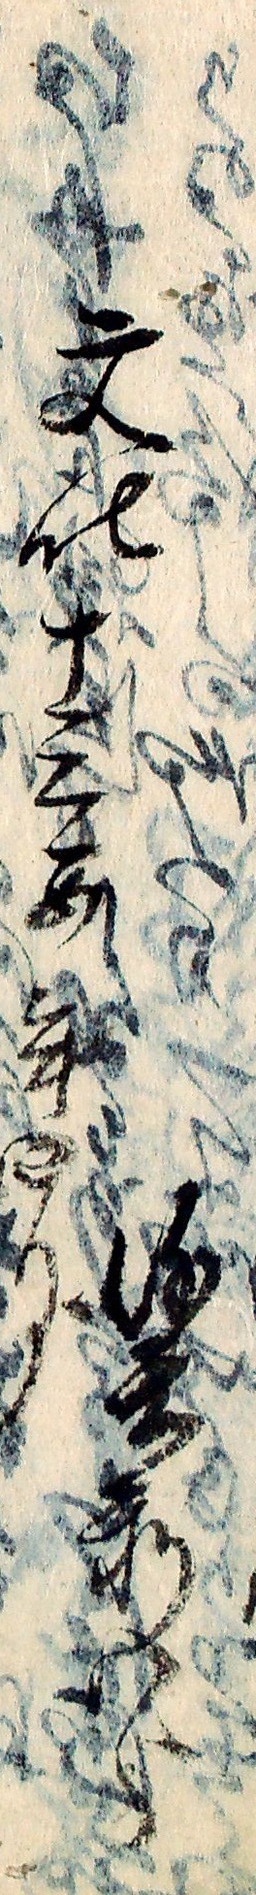文化十三子年四月
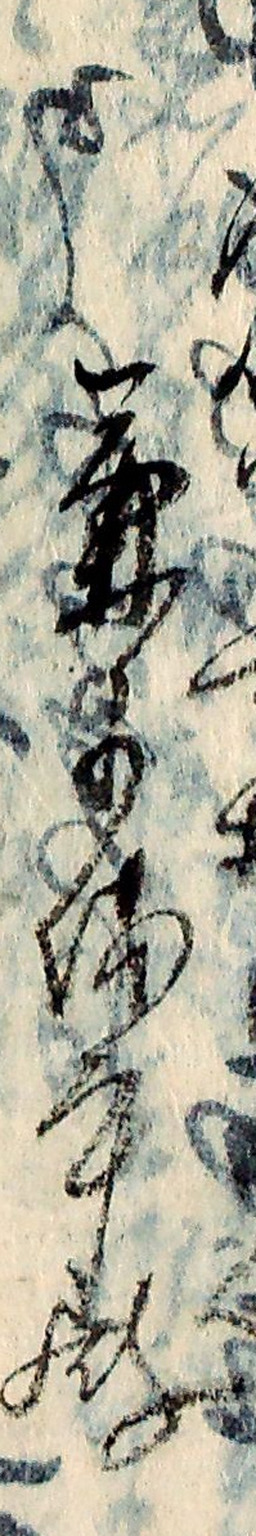兼子儀平殿
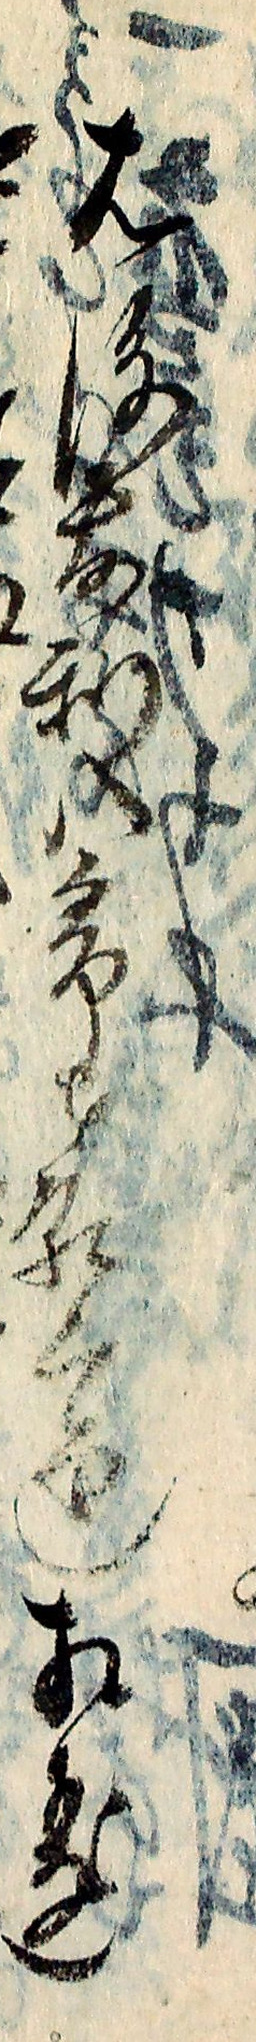右後藤利八郎奉願上通相違
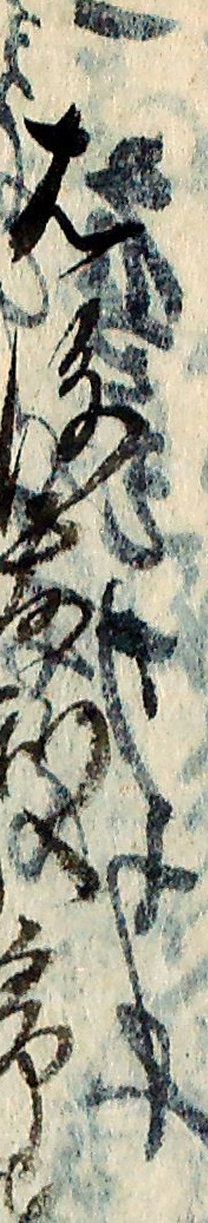後藤利八郎
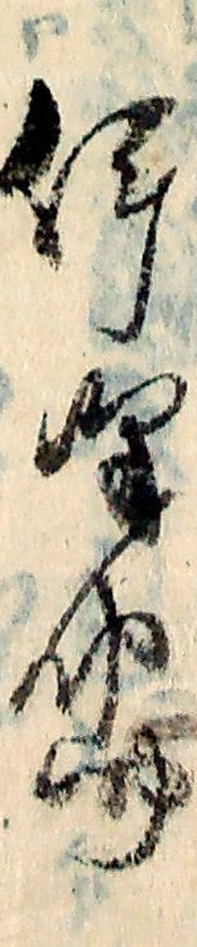伊沢仲助

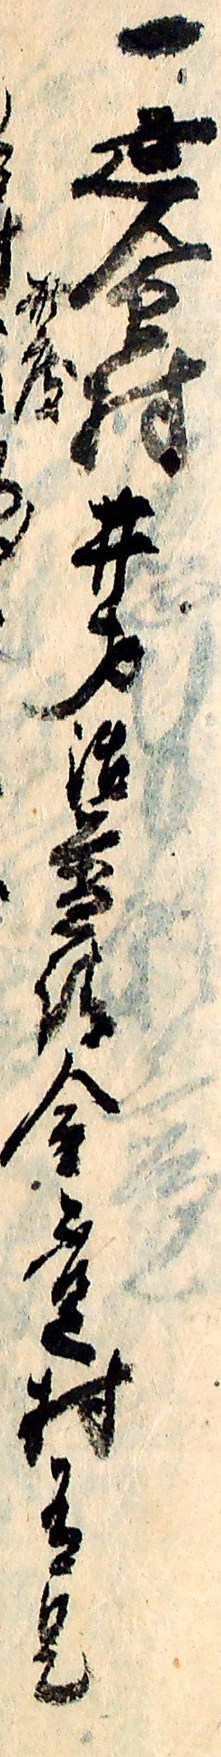一延命村井御普請金不足村有是
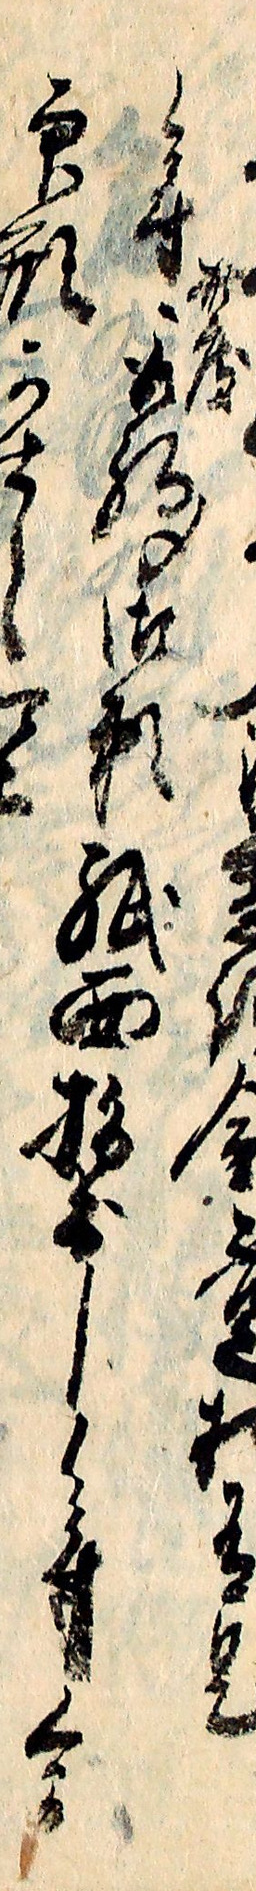候に付此度取約め御願紙面指出し候に付
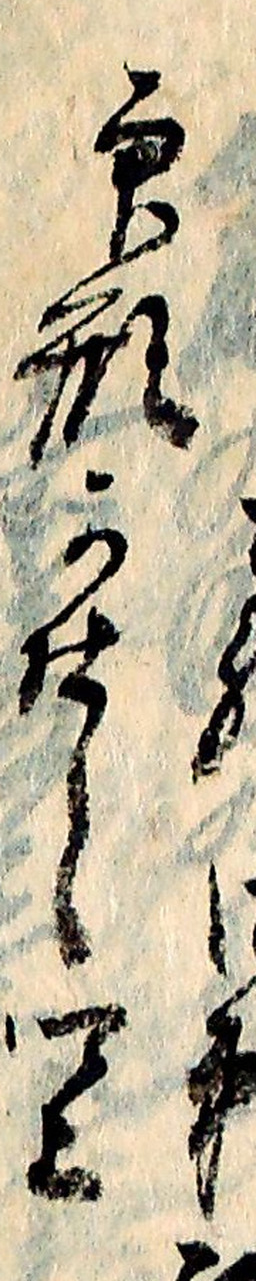印形可仕候以上
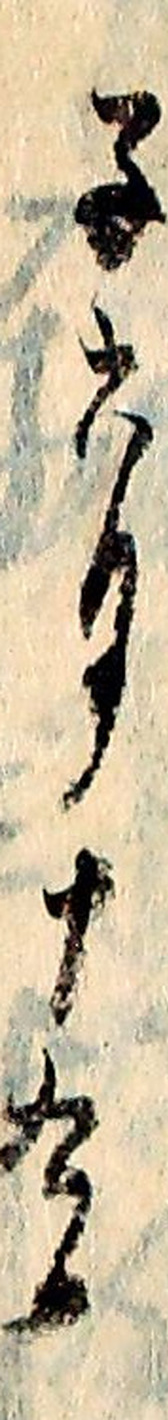子六月十九日
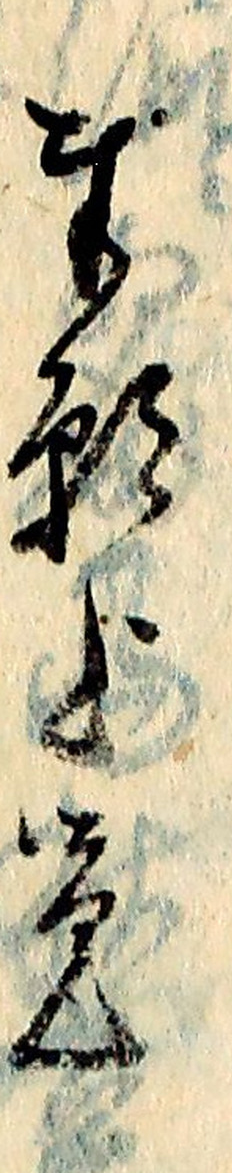奉願上覚
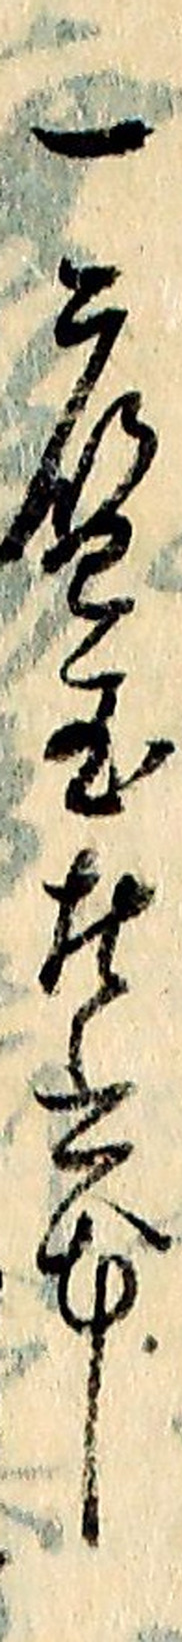一藍玉廿六本
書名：諸御願書控(後藤氏壱番）
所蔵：鳴門教育大学 Naruto University of Education
